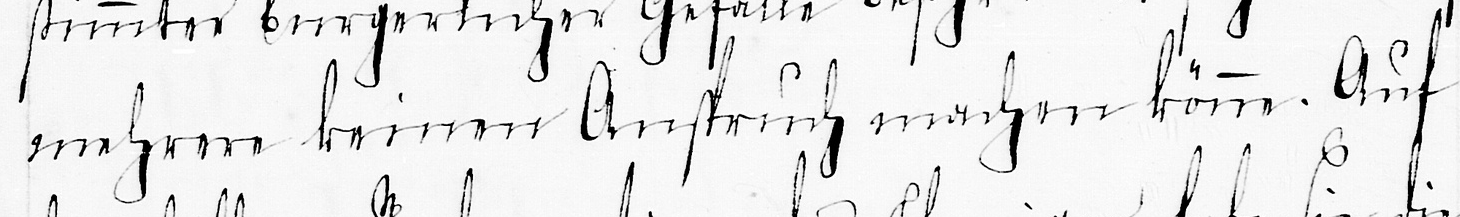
mehrere keinen Anspruch machen könne. Auf
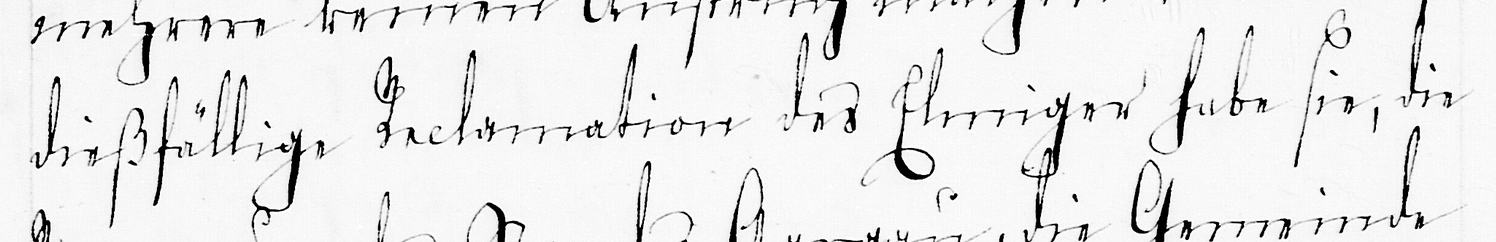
dießfällige Reclamation des Elmiger habe sie, die
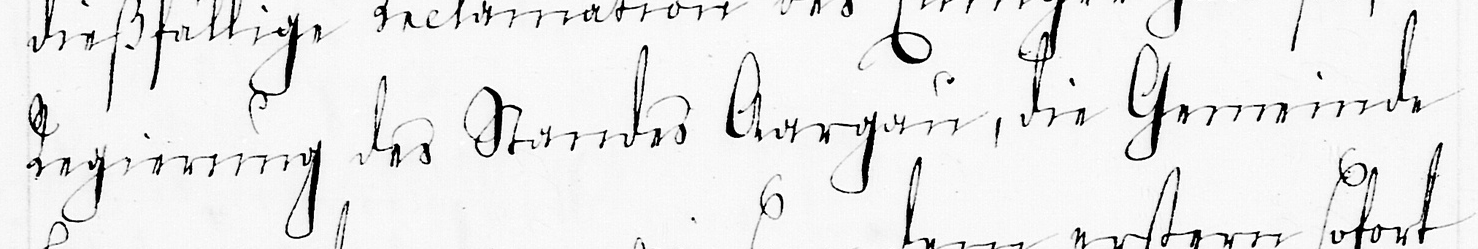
Regierung des Standes Aargau, die Gemeinde
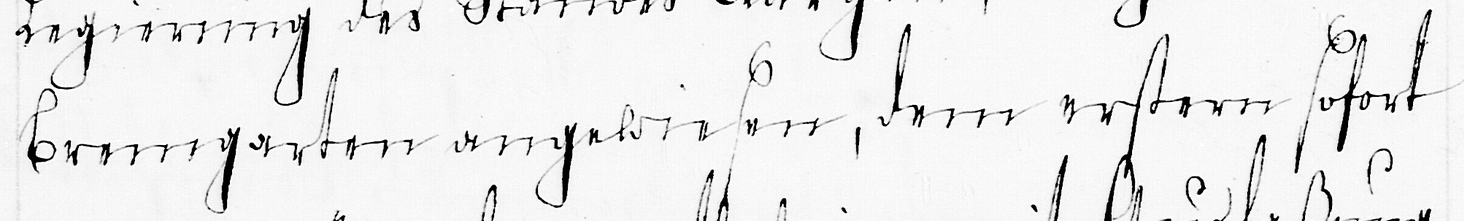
Bremgarten angewiesen, dem erstern sofort
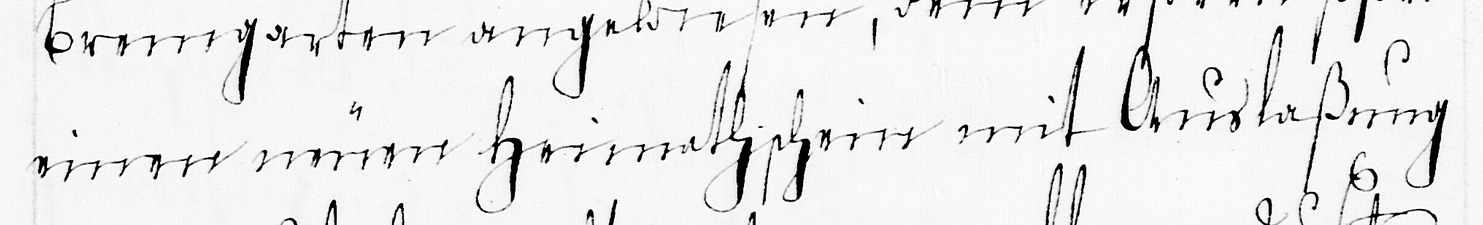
einen neuen Heimathschein mit Auslaßung
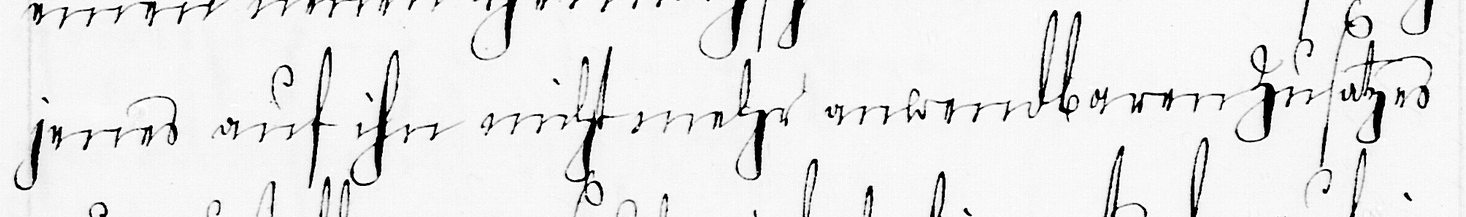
jenes auf ihn nicht mehr anwendbaren Zusatzes
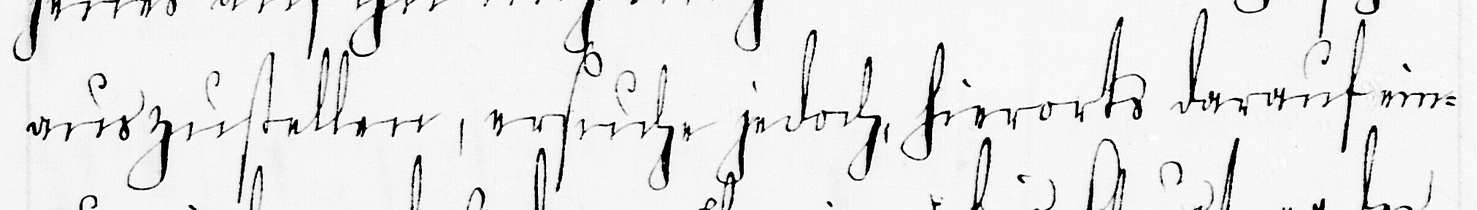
auszustellen, ersuche jedoch, hierorts darauf ein¬
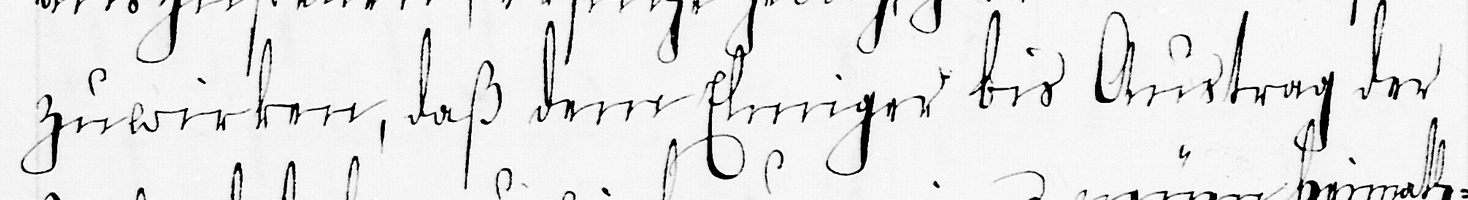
zuwirken, daß dem Elmiger bis Austrag der
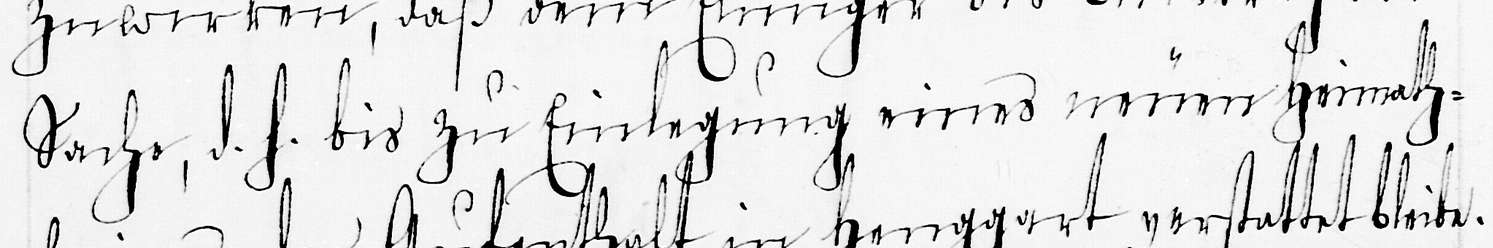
Sache, d. h. bis zu Einlegung eines neuen Heimath¬
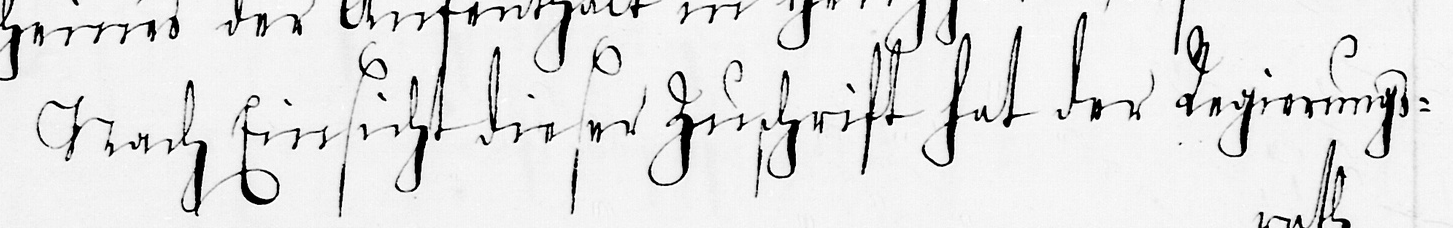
Nach Einsicht dieser Zuschrift hat der Regierungs-
